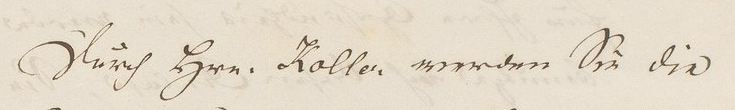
Durch Hrn. Koller werden Sie die
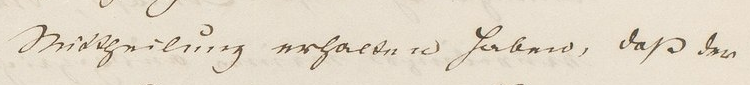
Mittheilung erhalten haben, daß der
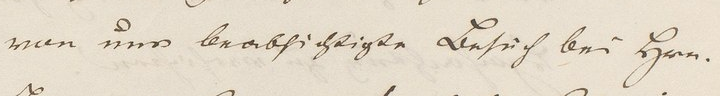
von uns beabsichtigte Besuch bei Hrn.
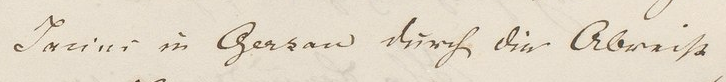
Jacini in Gersau durch die Abreise
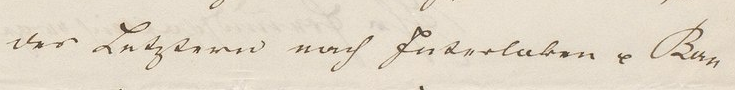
des Letztern nach Interlaken & Bern
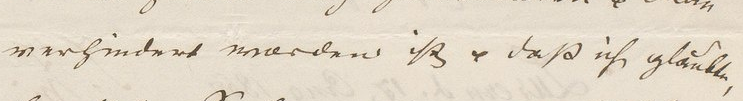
verhindert worden ist & daß ich glaubte,
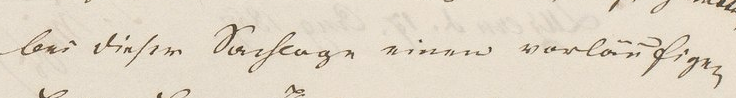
bei dieser Sachlage einen vorläufigen
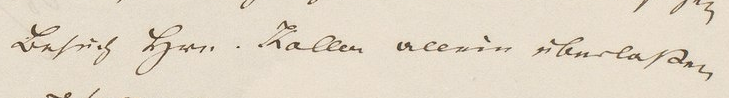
Besuch Hrn. Koller allein überlaßen
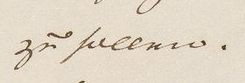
zu sollen.
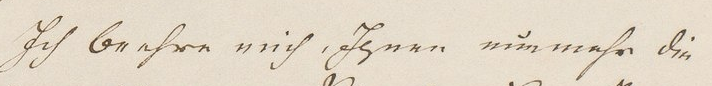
Ich beehre mich, Ihnen nunmehr die
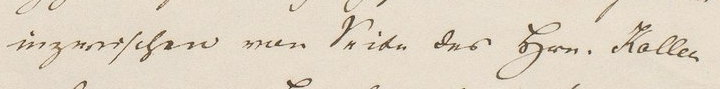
inzwischen von Seite des Hrn. Koller
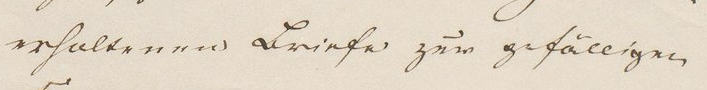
erhaltenen Briefe zur gefälligen
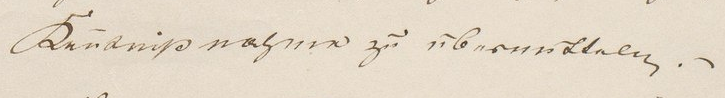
Kenntnißnahme zu übermitteln. –
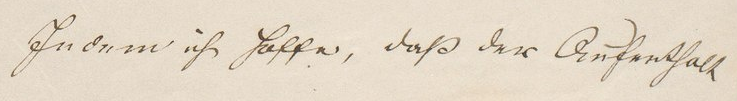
Indem ich hoffe, daß der Aufenthalt
